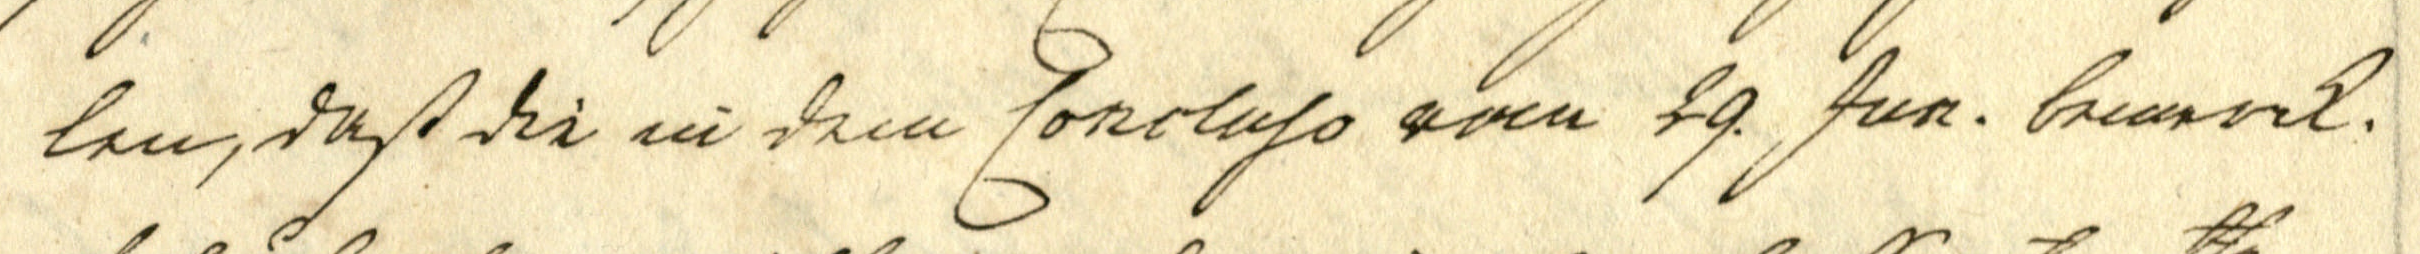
len, daß die in dem Concluso vom 29. Jun. bemerck¬
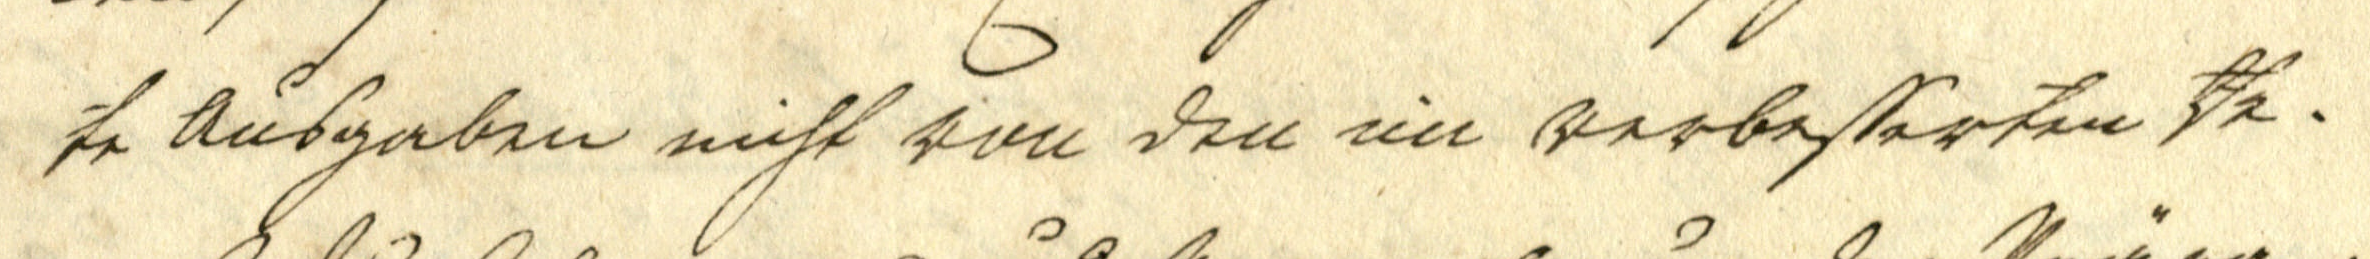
te Ausgaben nicht von den im verbesserten Re¬
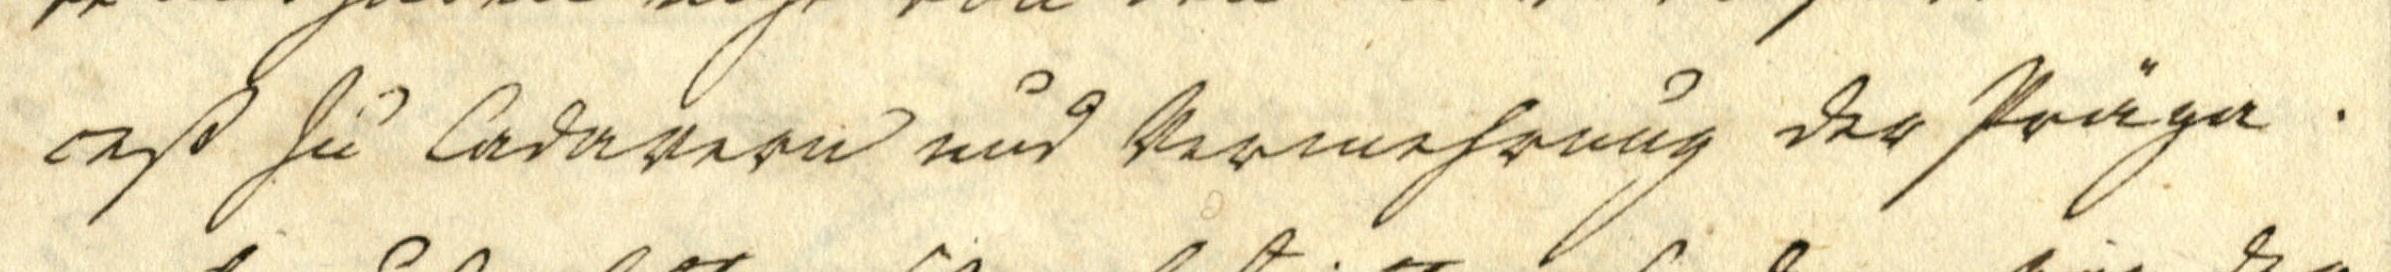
ceß zu Cadavern und Vermehrung der Präpa¬
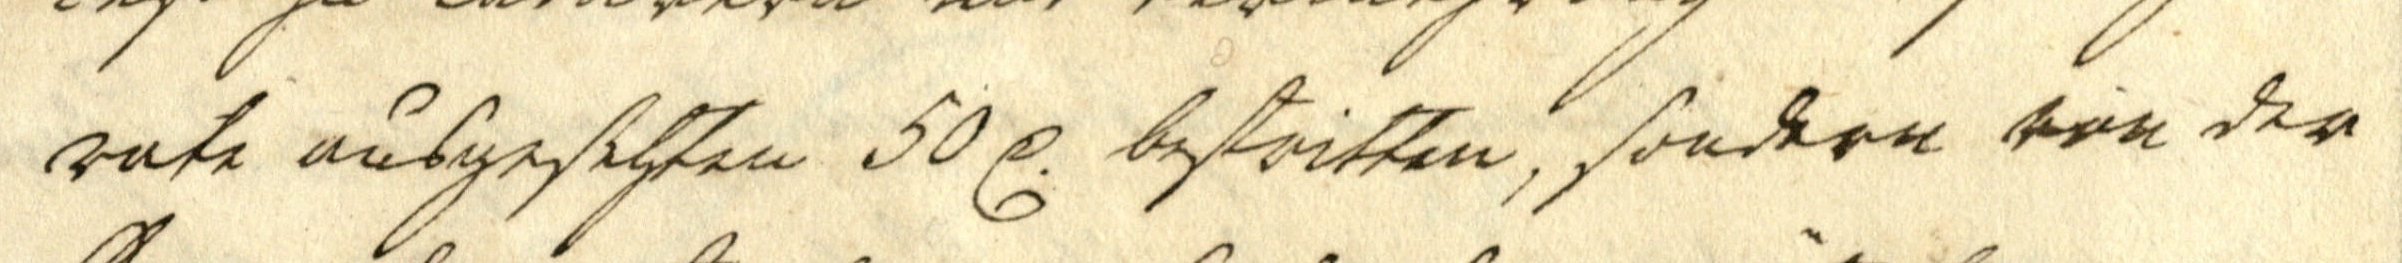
rate ausgesetzten 50 l. bestritten, sondern von der
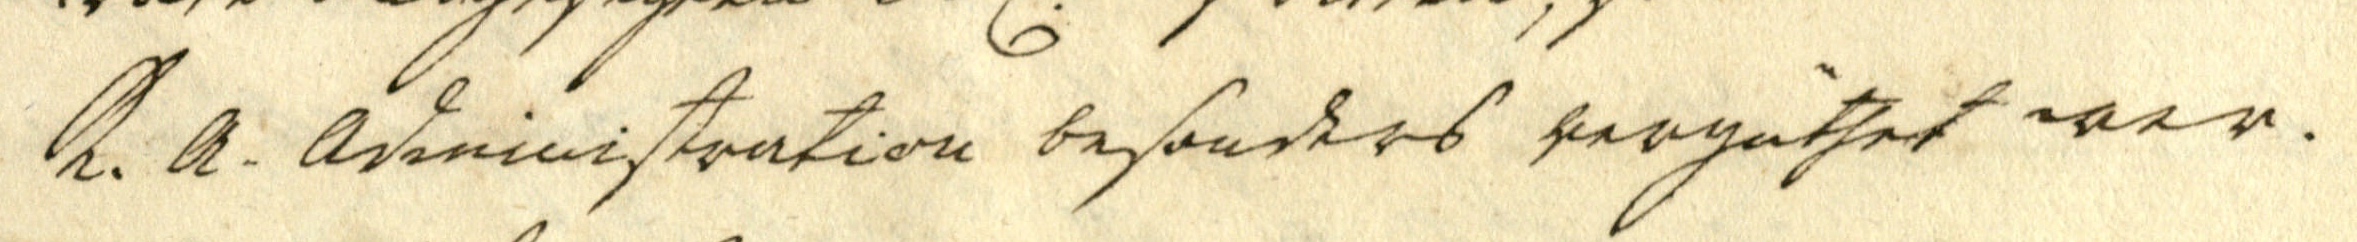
K. A. Administration besonders vergüthet wer¬
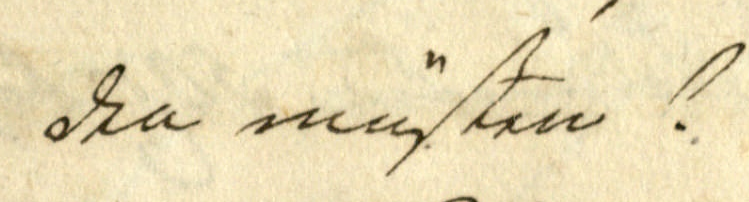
den müsten.
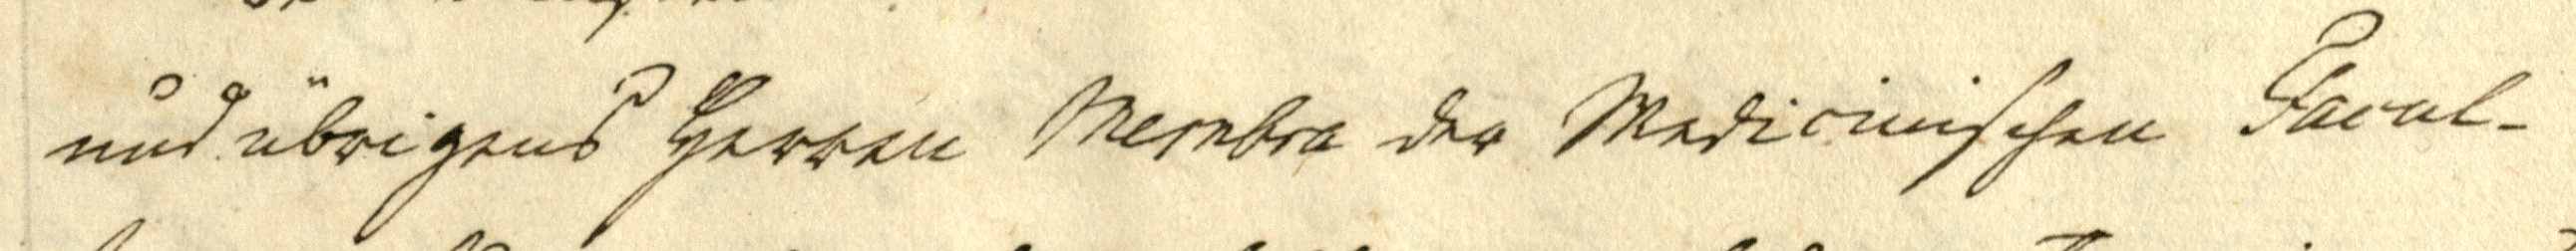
und übrigens Herren Membra der Medicinischen Facul¬
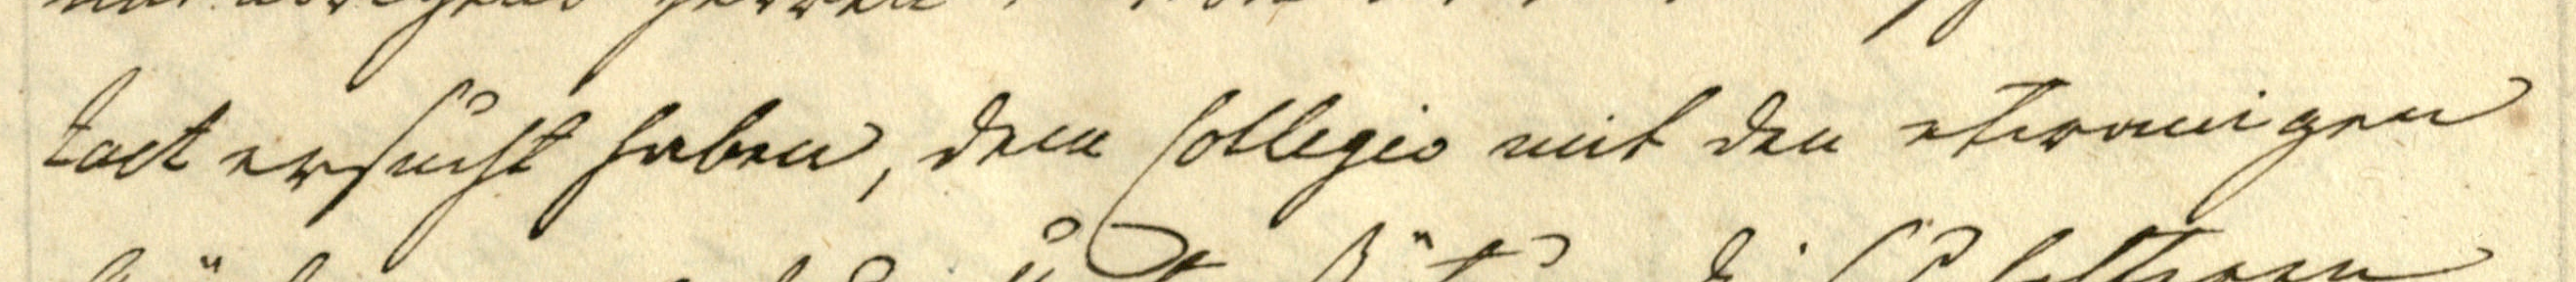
taet ersucht haben, dem Collegio mit den etwanigen
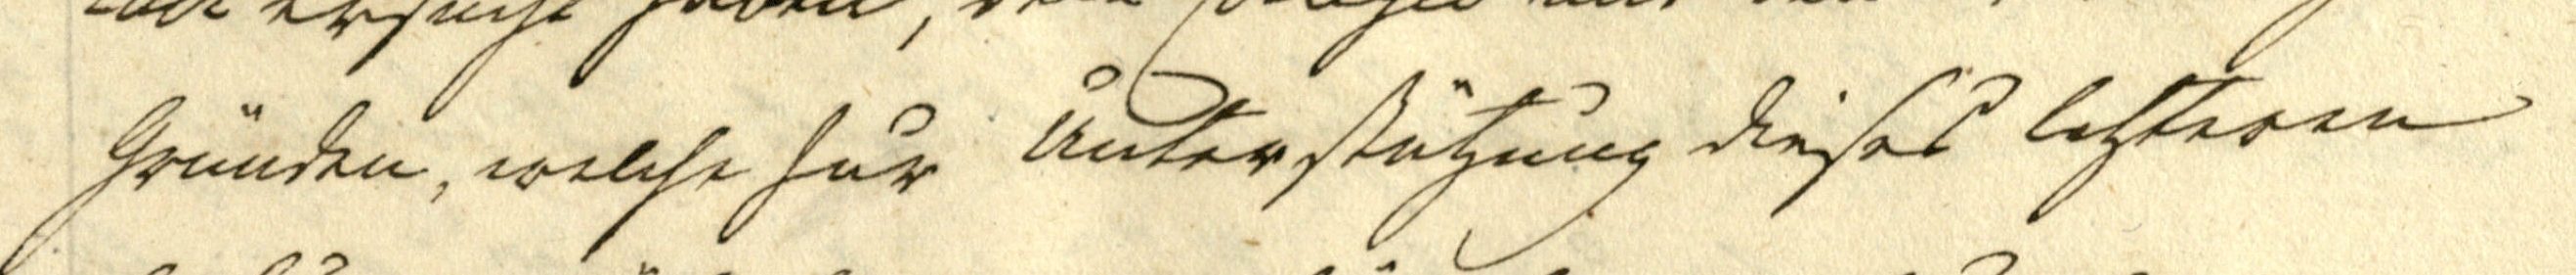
Gründen, welche für Unterstützung dieses letzteren
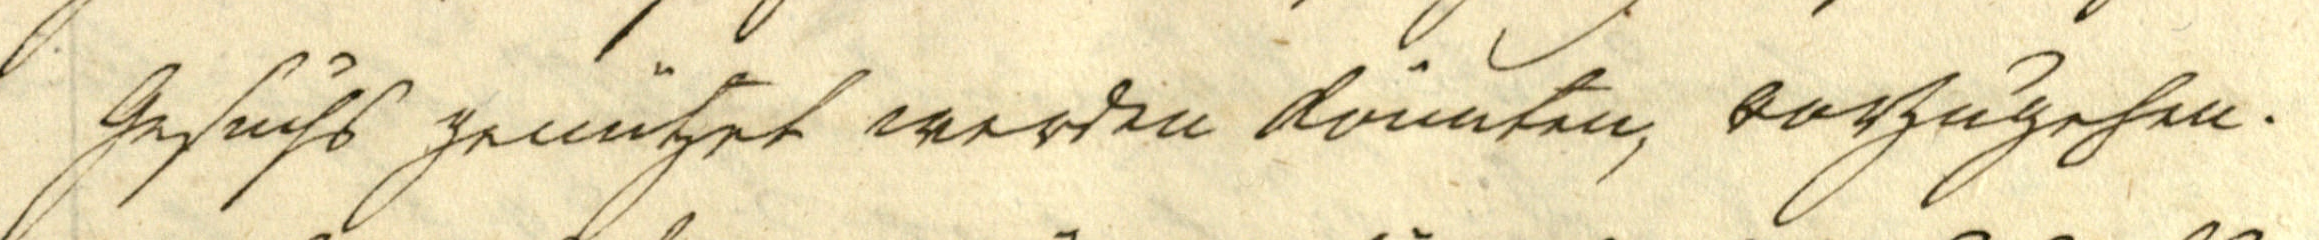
Gesuchs genützet werden könnten, vorzugehen.
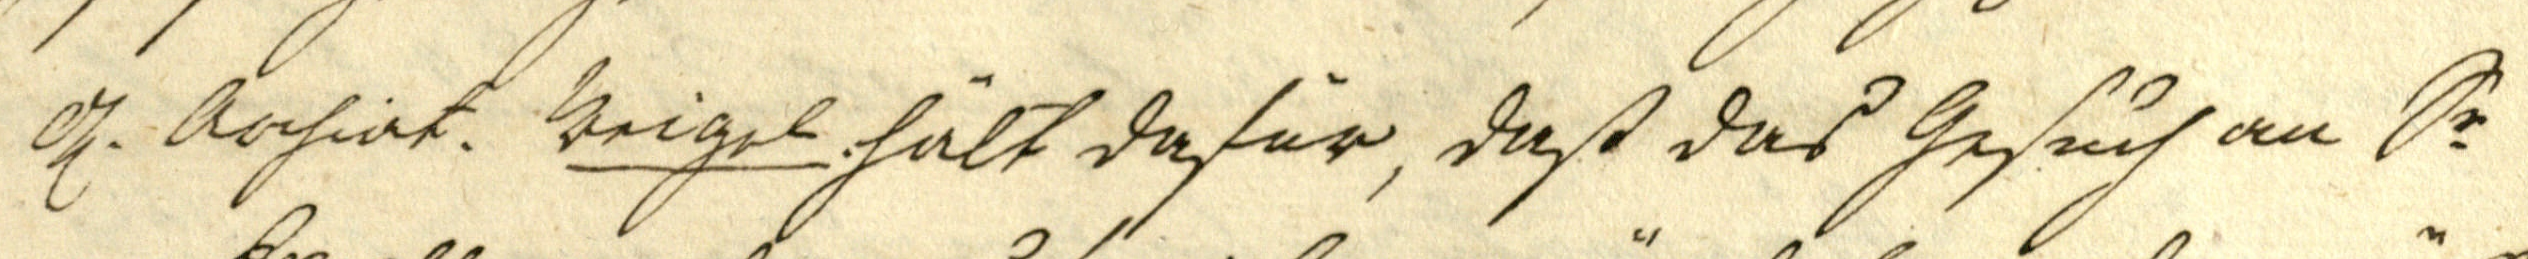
dh. Archiat. Weigel hält dafür, daß das Gesuch an Sr.
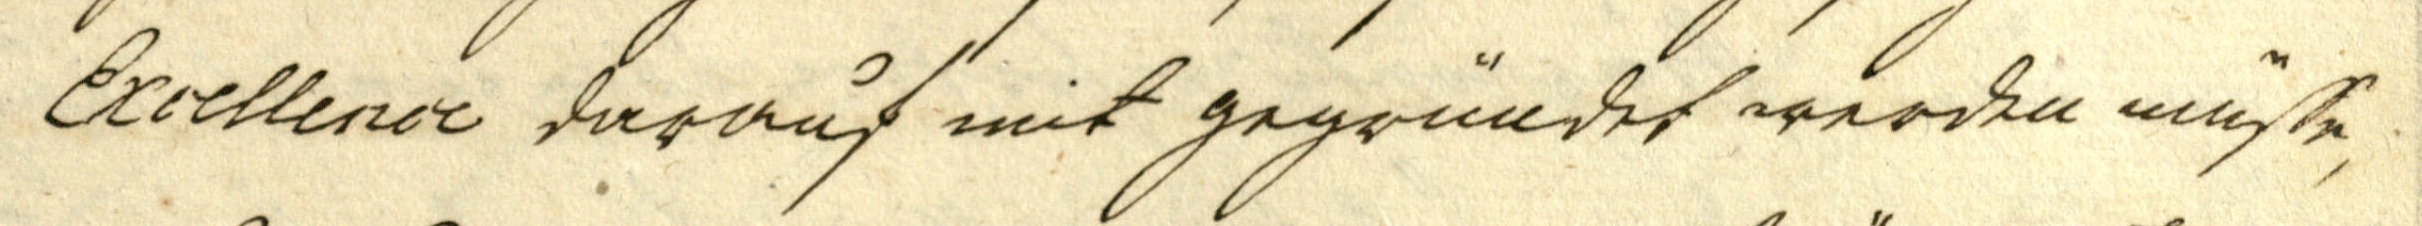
Excellence darauf mit gegründet werden müsse,
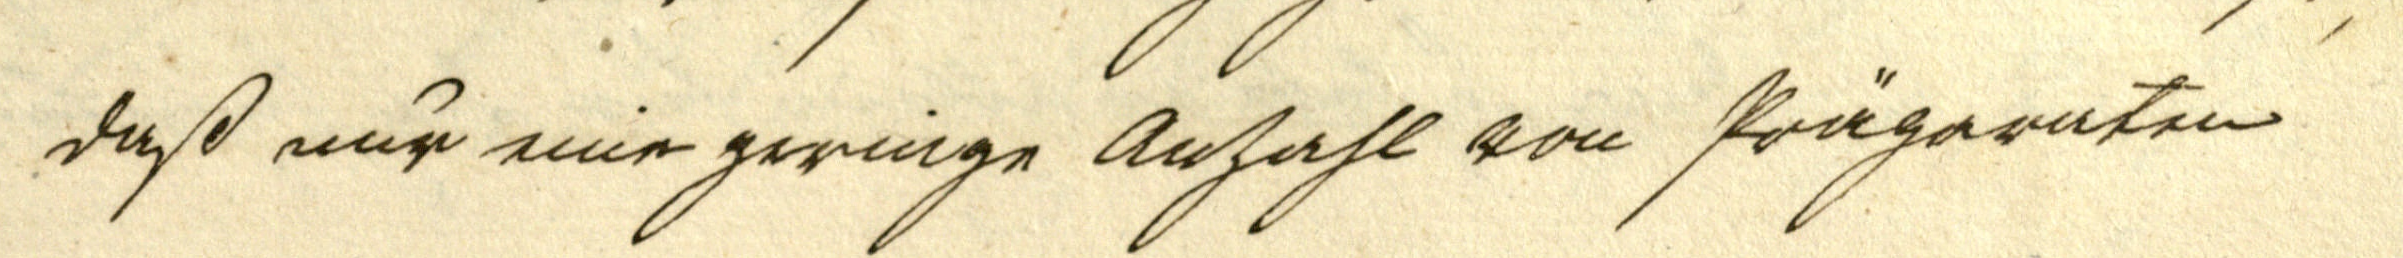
daß nur eine geringe Anzahl von Präparaten
